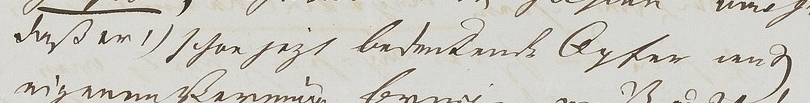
daß er 1) schon jezt bedeutende Opfer aus
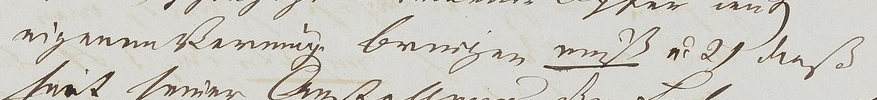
eigenen Vermög. bringen muß u. 2) daß
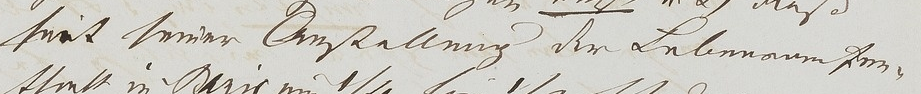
seit seiner Anstellung der Lebensaufen-
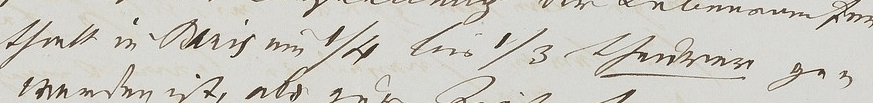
thalt in Paris um ¼ bis ⅓ theurer ge-
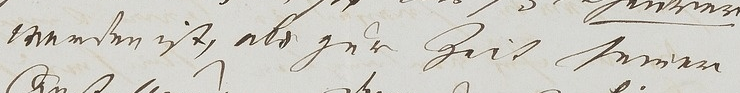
worden ist, als zur Zeit seiner
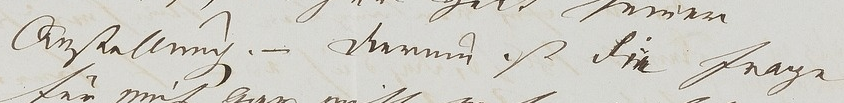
Anstellung. – Darum ist die Frage
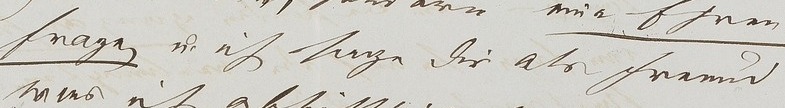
frage u. ich sage dir als Freund
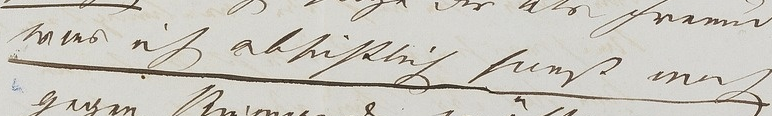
was ich absichtlich sonst noch
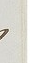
habe,
